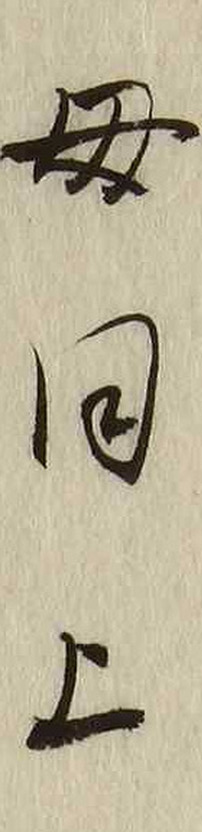母同上
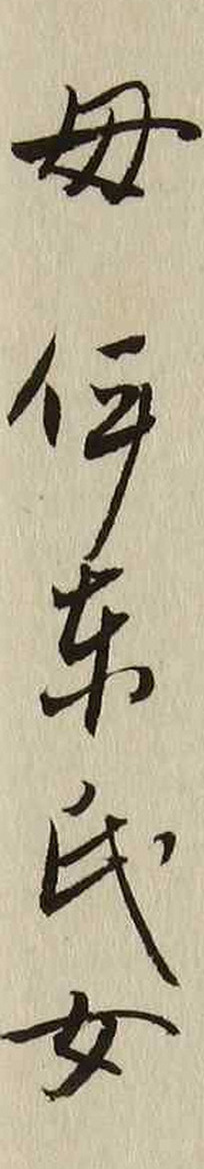母伊東氏女
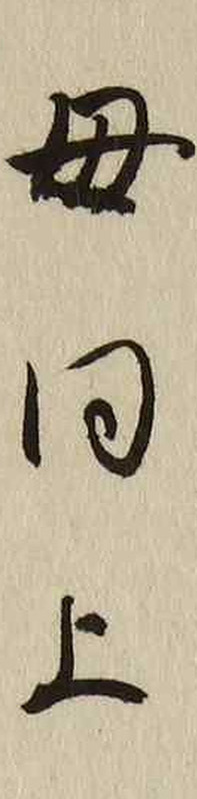母同上
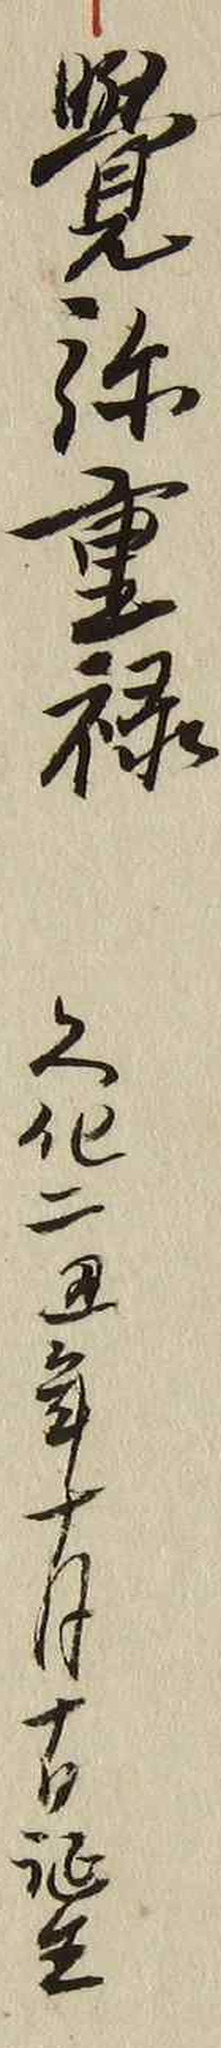覚弥重禄文化二丑年十月十日誕生
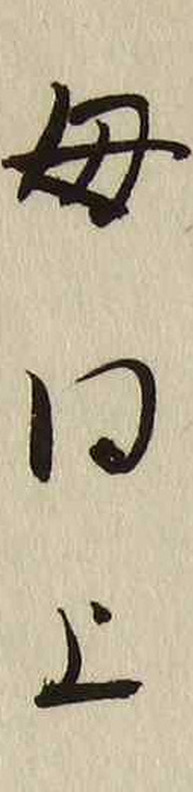母同上
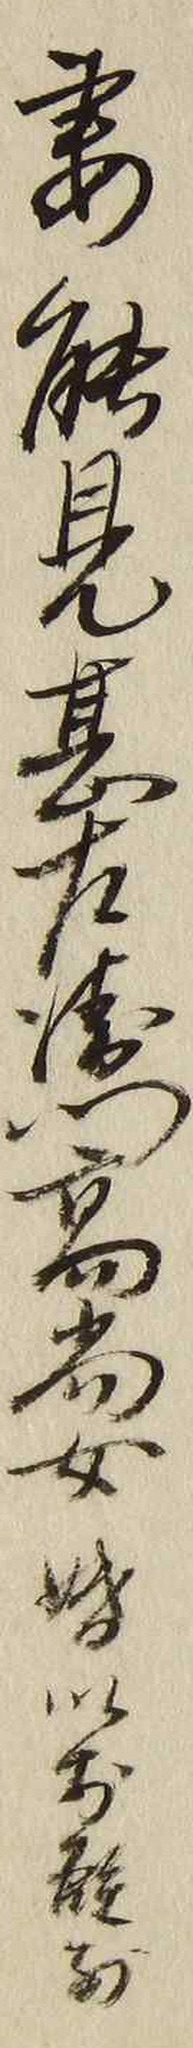妻能見甚左衛門高尚女婚以前離別

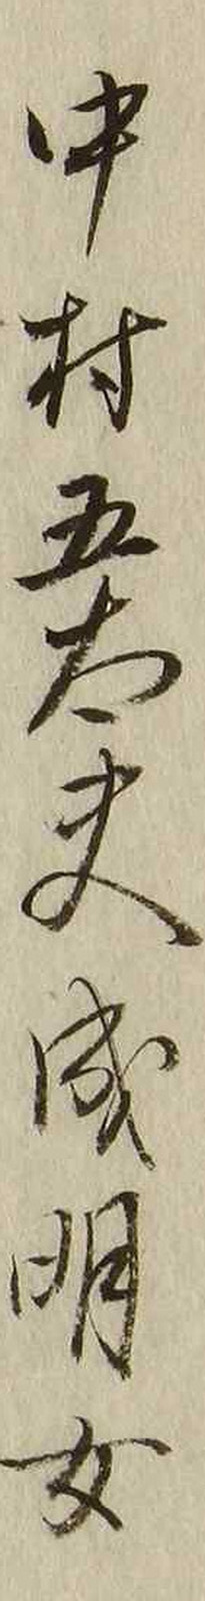中村五太夫成明女
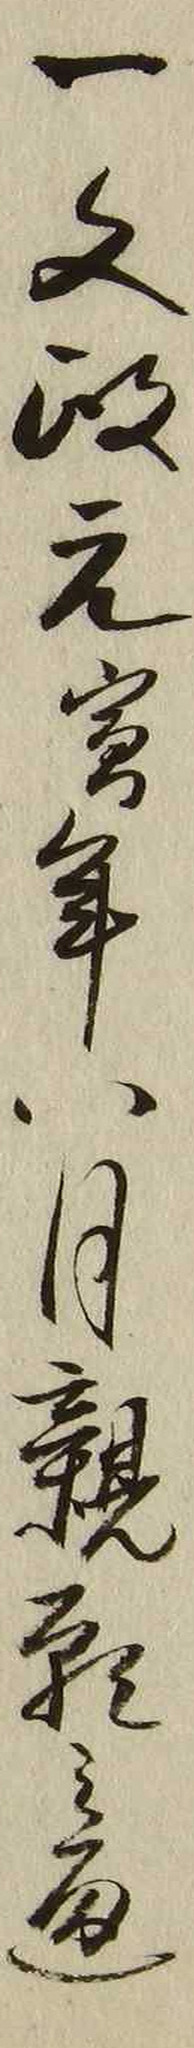一文政元寅年八月親願之通
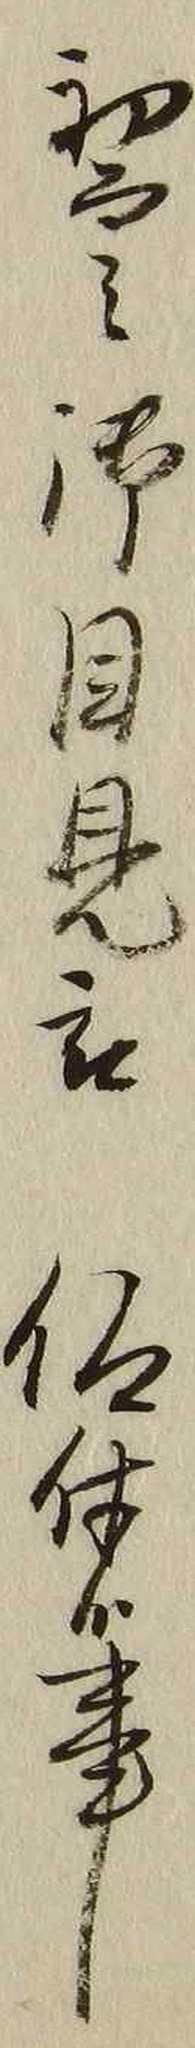初而之御目見被仰付候事

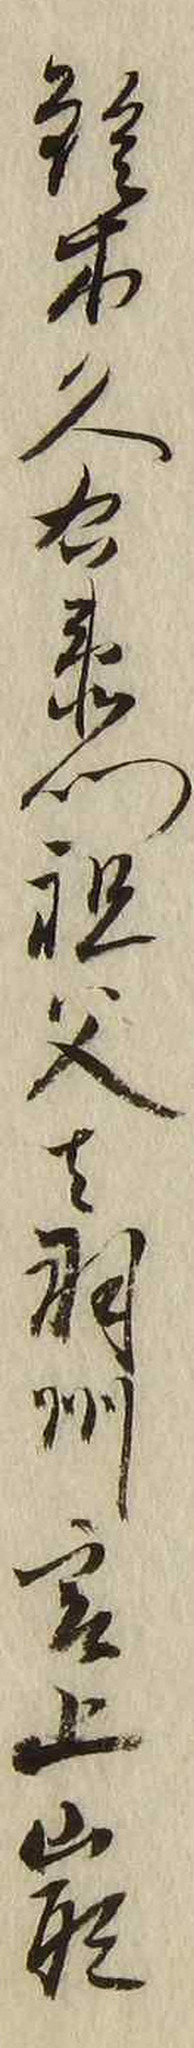鈴木久右衛門祖父は羽州最上山形

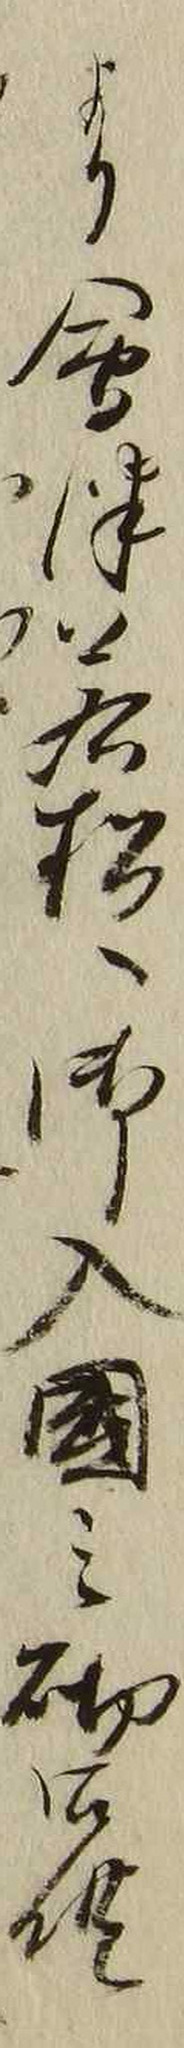より会津若松へ御入国之砌御供
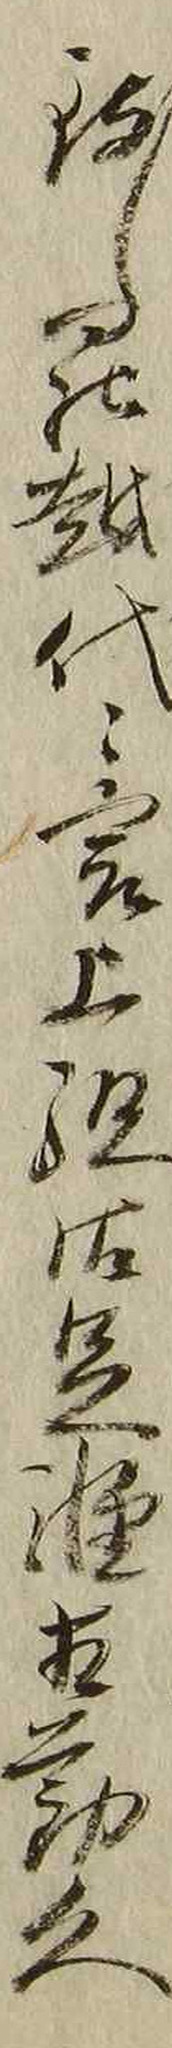致し罷越代々最上組御足軽相勤久
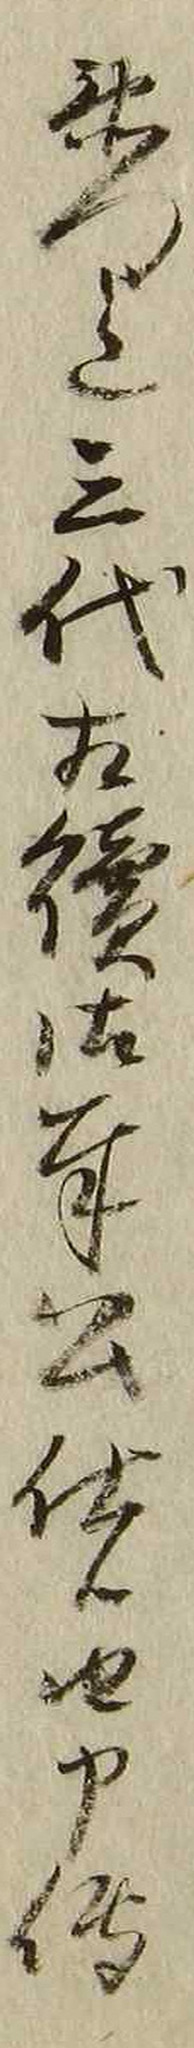衛門迄三代相続御奉公仕候由申伝
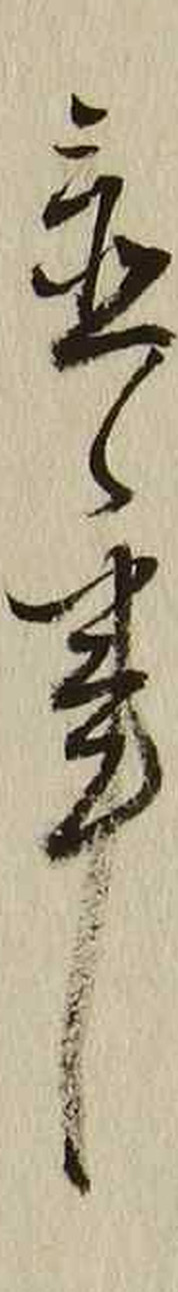置候事
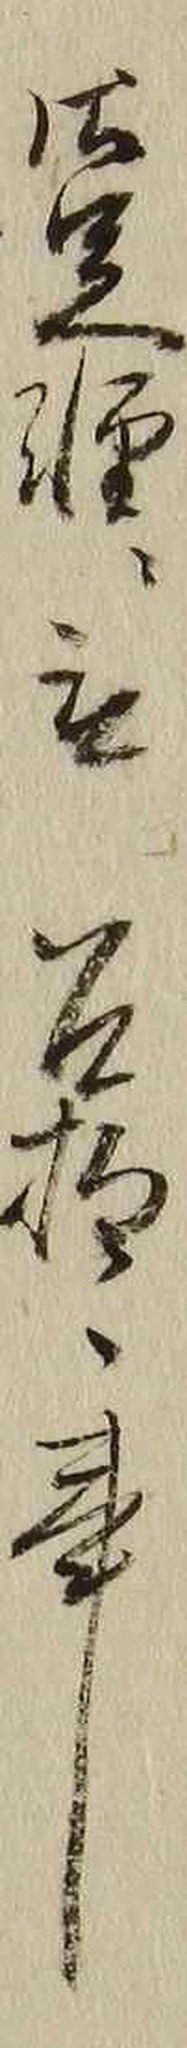御足軽ニ被召抱候事
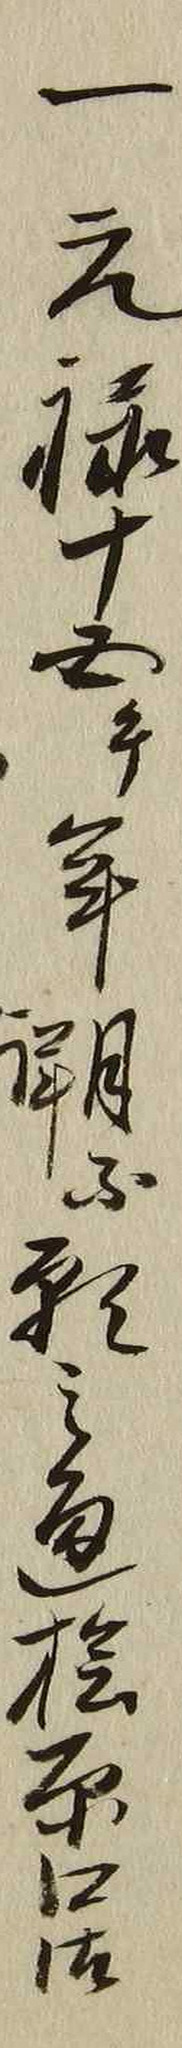一元禄十五午年月不詳願之通桧原口御
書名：諸士系譜　巻之352　す之部2
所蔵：会津若松市立会津図書館
